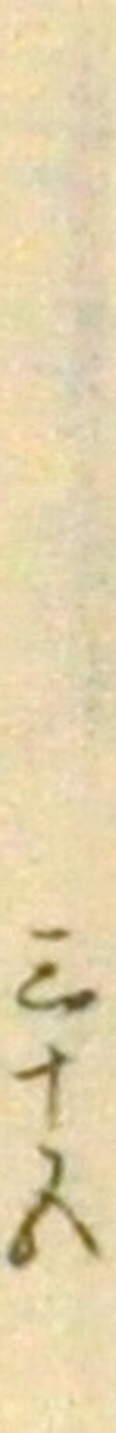三十五
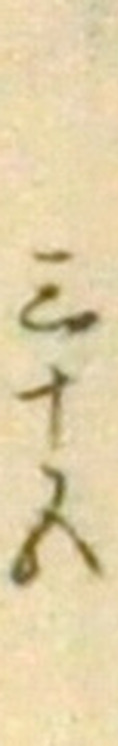三十五
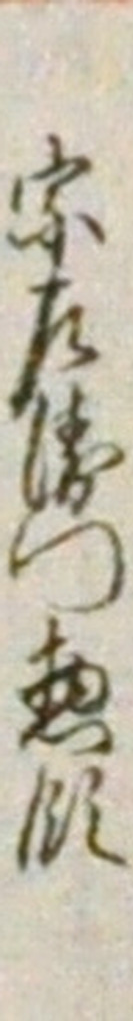宗左衛門惣領
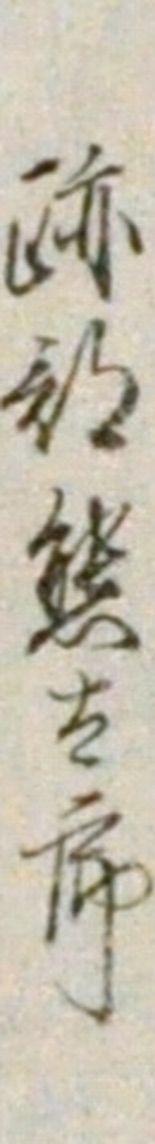跡部熊太郎
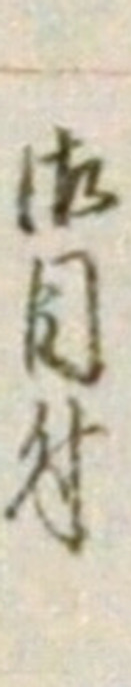御目付
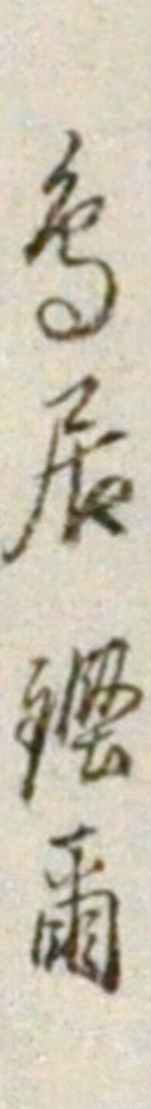鳥居鏗爾
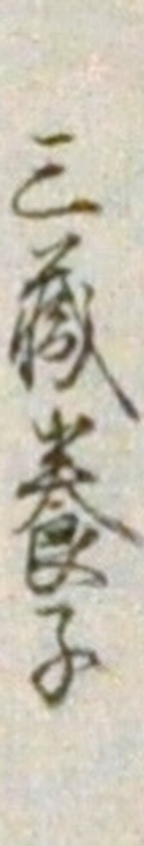三蔵養子
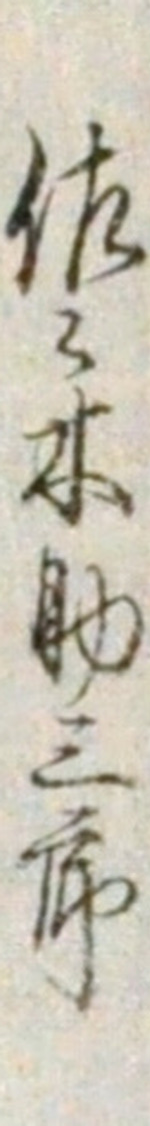佐々木助三郎
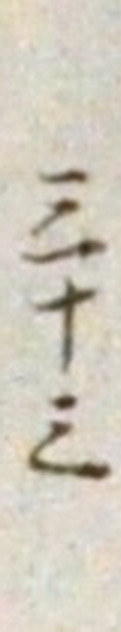三十三
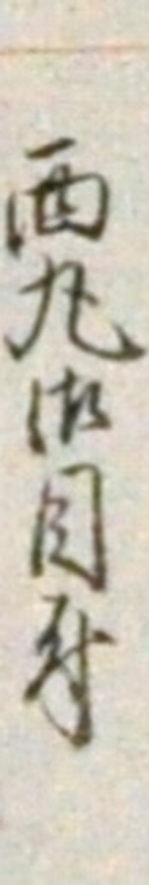西丸御目付
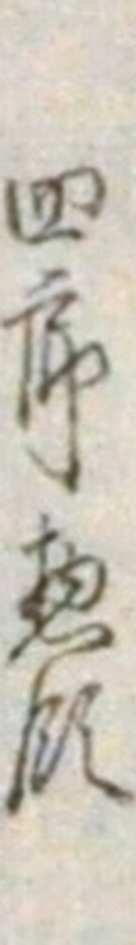四郎惣領
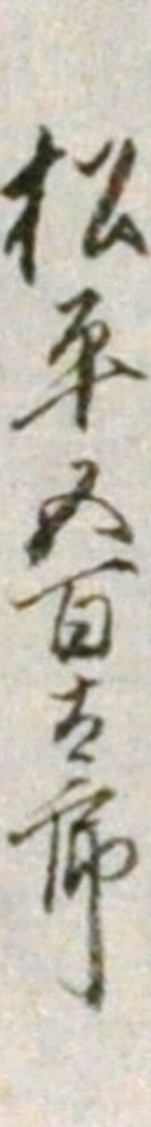松平五百太郎
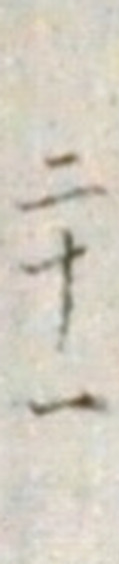二十一
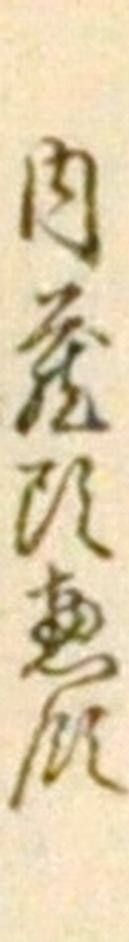内蔵頭惣領
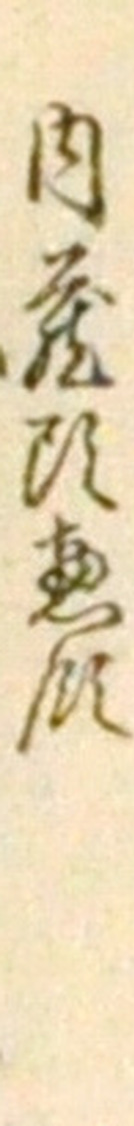内蔵頭惣領
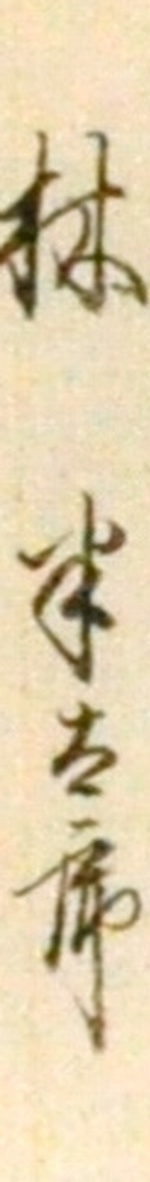林半太郎
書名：若年寄御役中之御書物〔一括〕
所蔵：伊那市立高遠町図書館・合同会社AMANE
